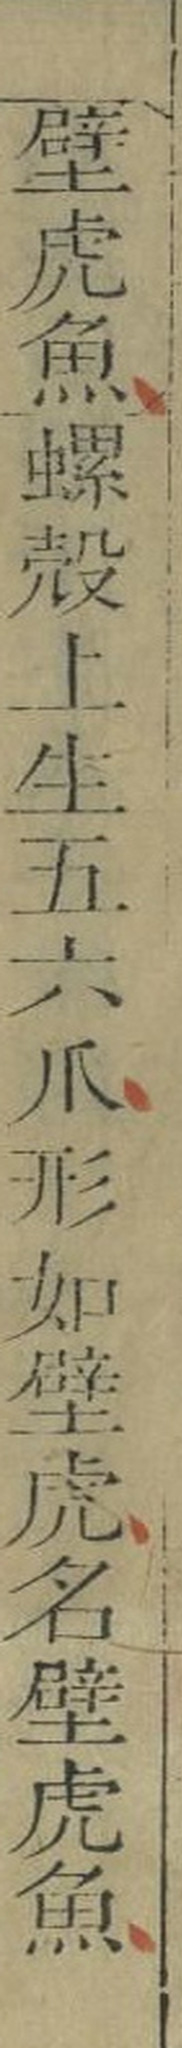[壁虎魚]螺殻上生五六爪形如壁虎名壁虎魚
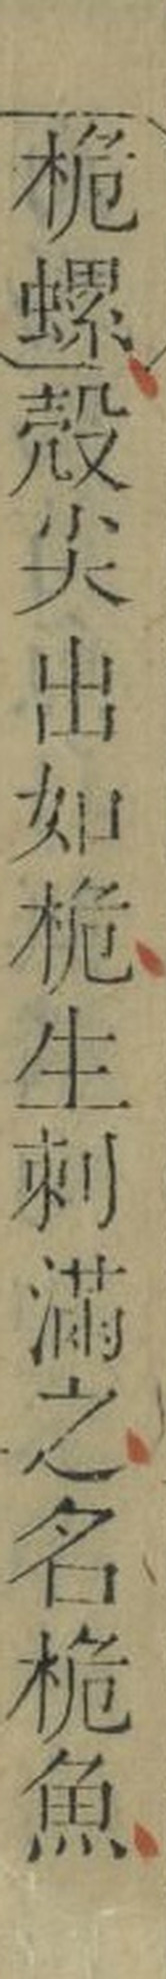[桅螺]殻尖出如桅生刺満之名桅魚
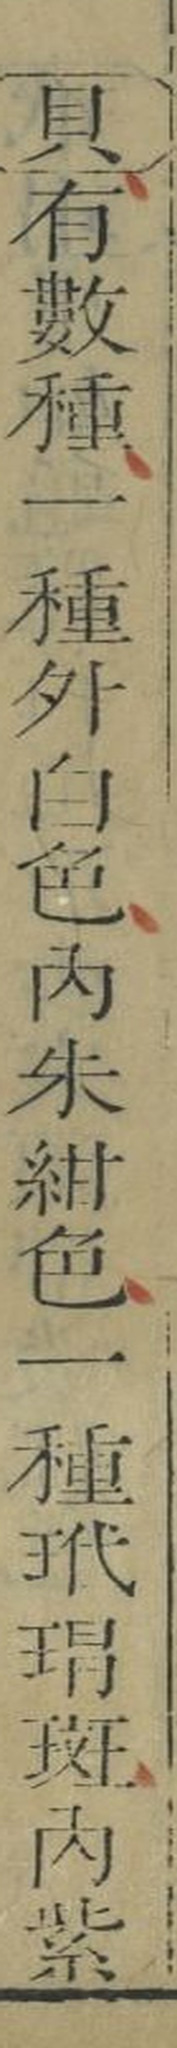[貝]有数種一種外白色内朱紺色一種玳瑁斑内紫
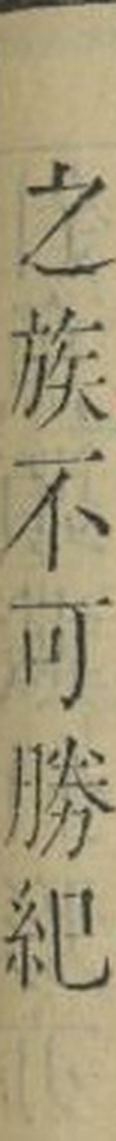之族不可勝紀
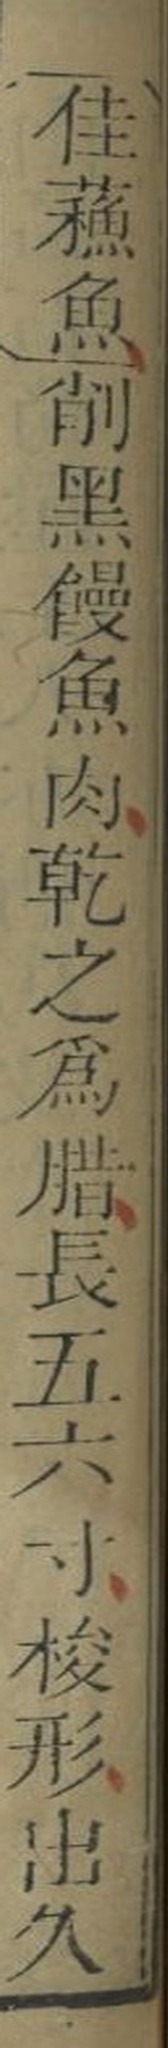[佳蘇魚]削黒饅魚肉乾之為腊長五六寸梭形出久
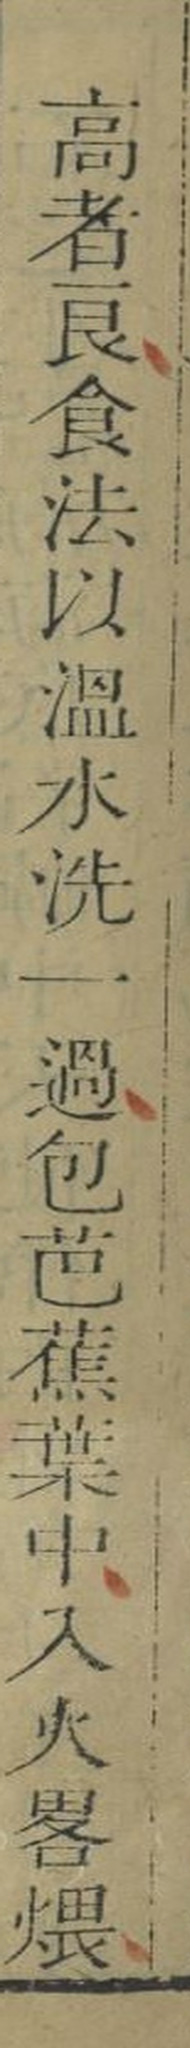高者良食法以温水洗一過包芭蕉葉中入火略煨
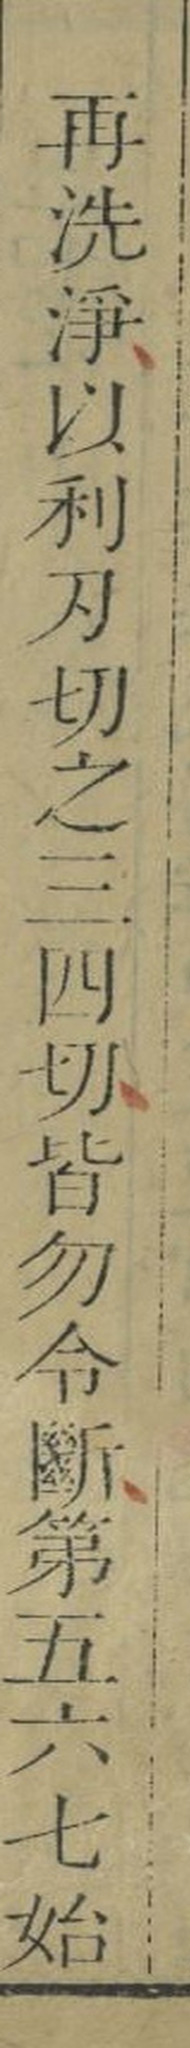再洗浄以利刃切之三四切皆勿令断第五六七始
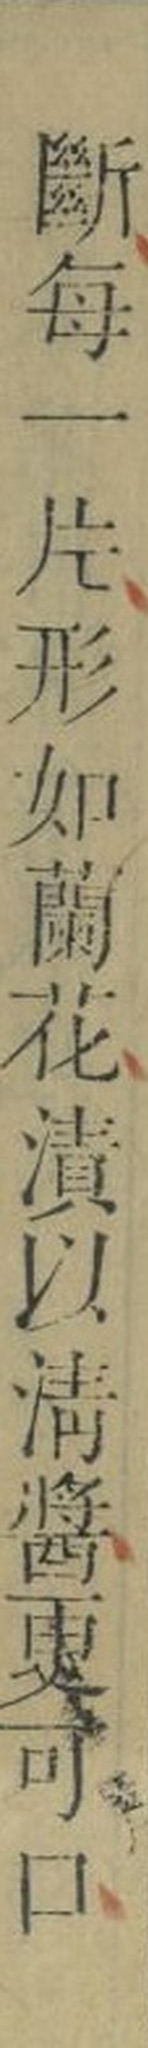断毎一片形如蘭花漬以清醬更可口
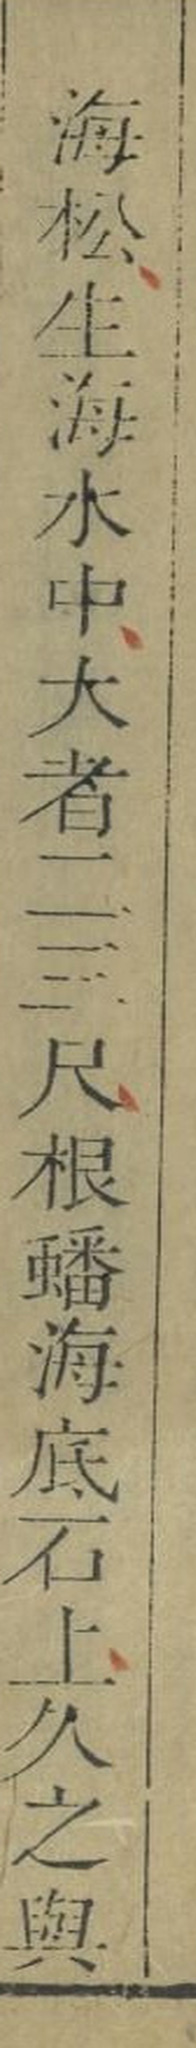海松生海水中大者二三尺根蟠海底石上久之与
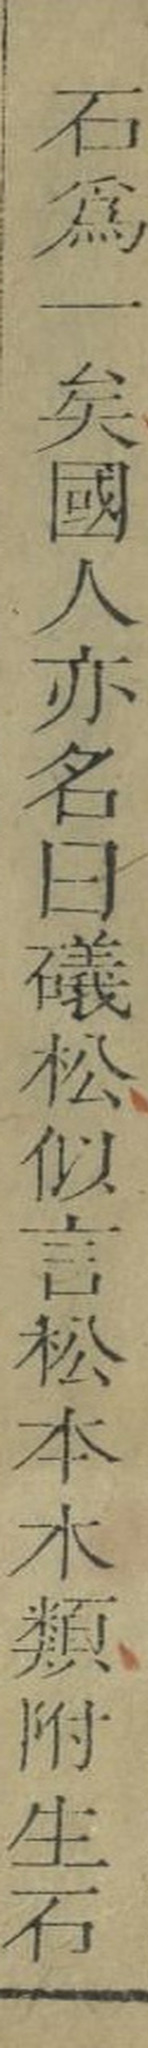石為一矣国人亦名曰礒松似言松本木類附生石
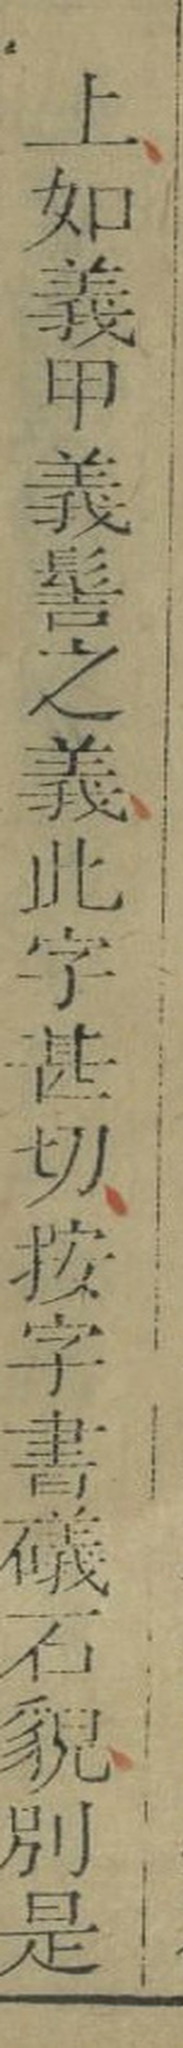上如義甲義髻之義此字甚切按字書礒石貌別是
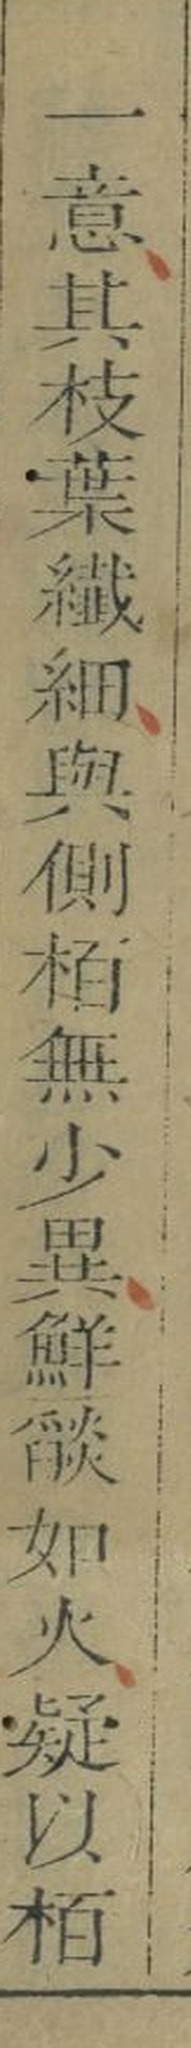一意其枝葉繊細与側栢無少異鮮燄如火疑以栢

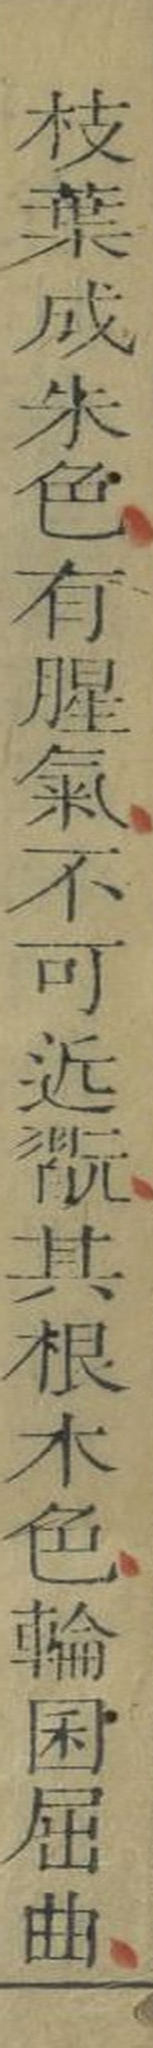枝葉成朱色有腥気不可近翫其根木色輪囷屈曲
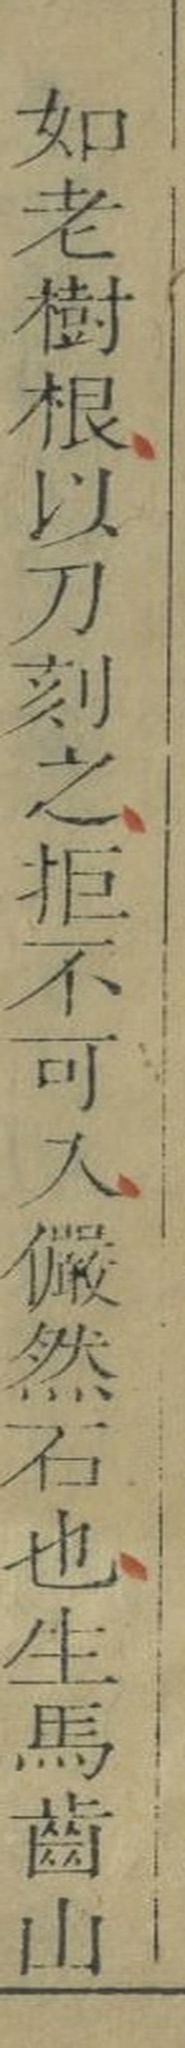如老樹根以刀刻之拒不可入儼然石也生馬歯山
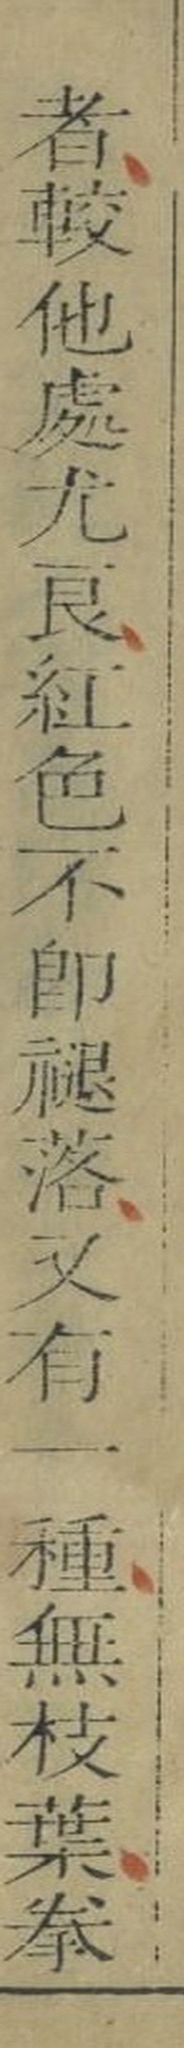者較他処尤良紅色不即褪落又有一種無枝葉拳
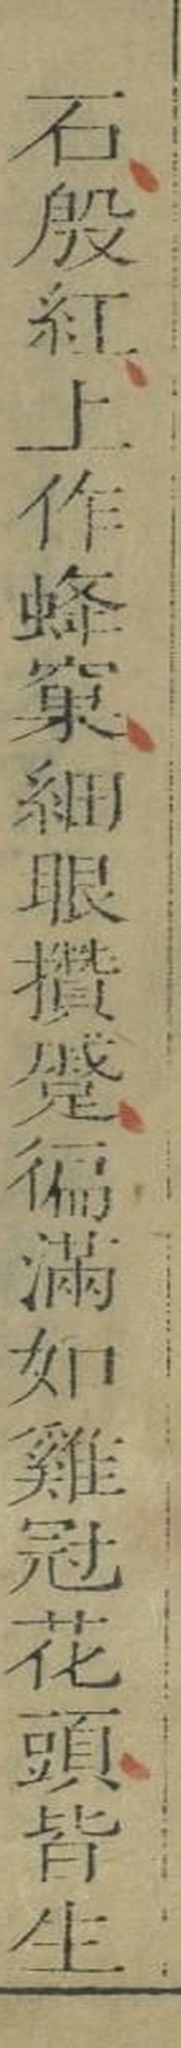石殷紅上作蜂窠細眼攢蹙徧満如鶏冠花頭皆生
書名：中山伝信録 巻六
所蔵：University of the Ryukyus Library
